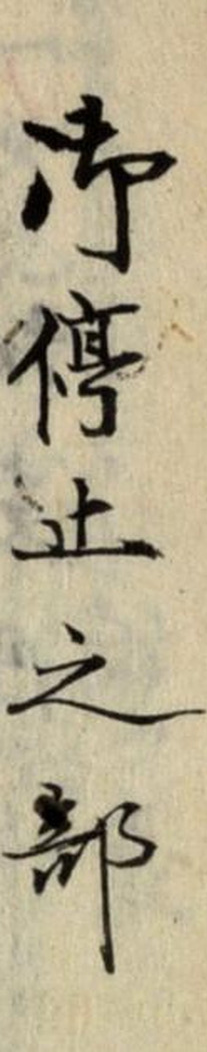御停止之部
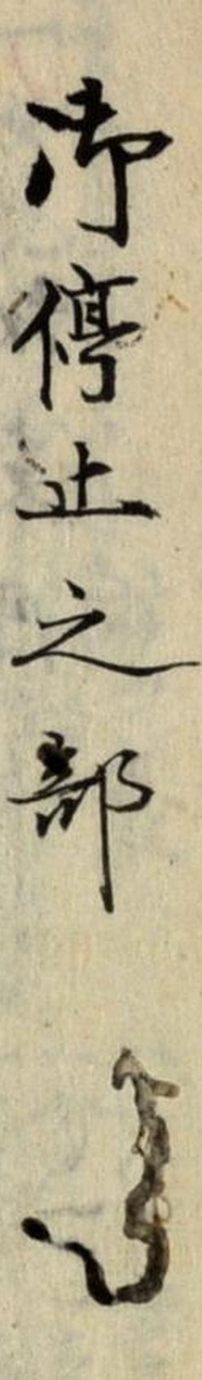御停止之部
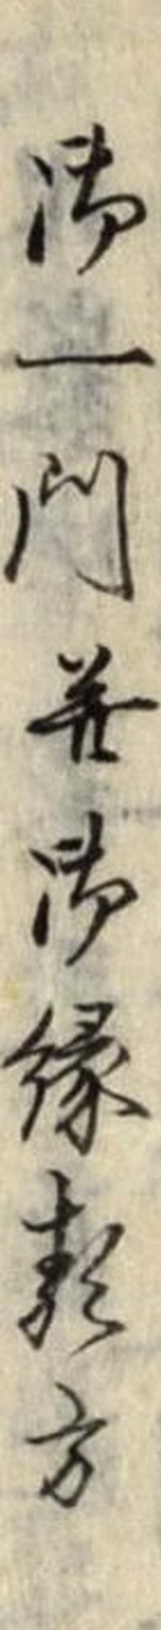ト御一門并御縁類方
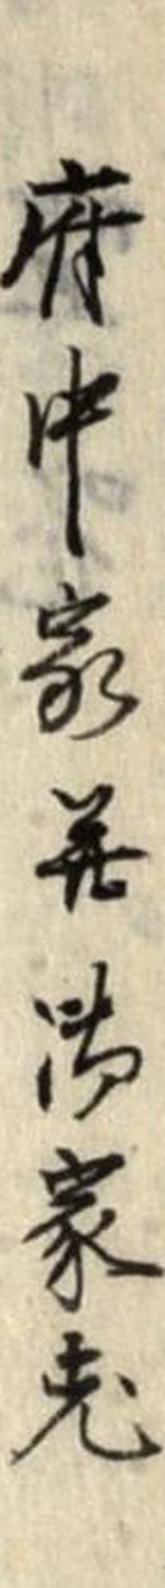ヌ府中家并御家老
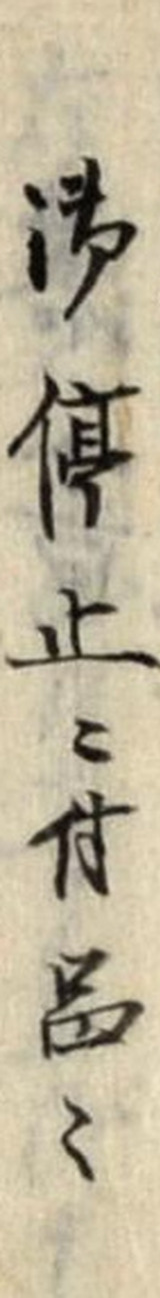ル御停止に付品々
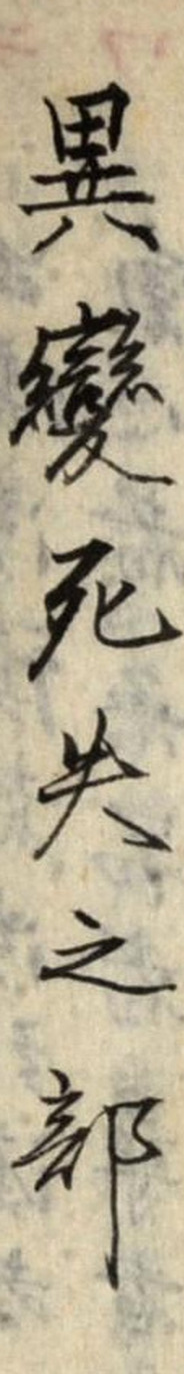異変死失之部

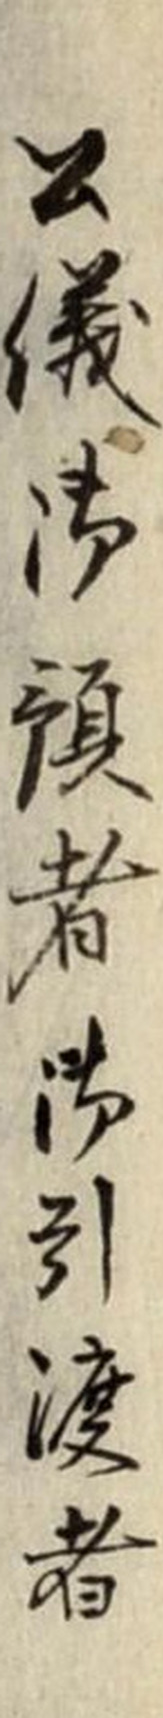ヲ公儀御預者御引渡者
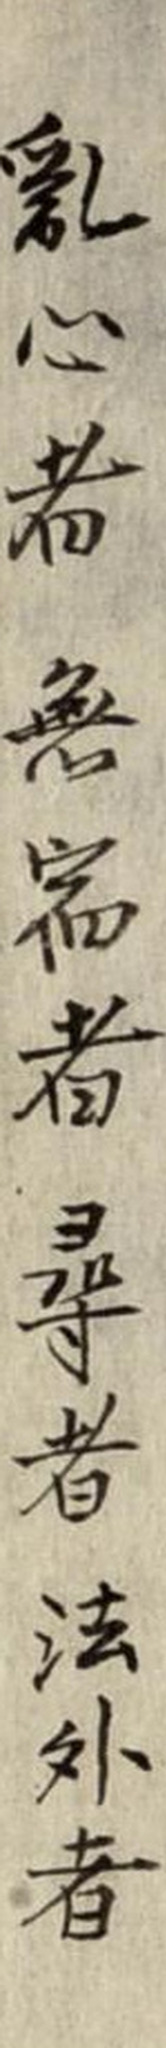ワ乱心者無宿者尋者法外者
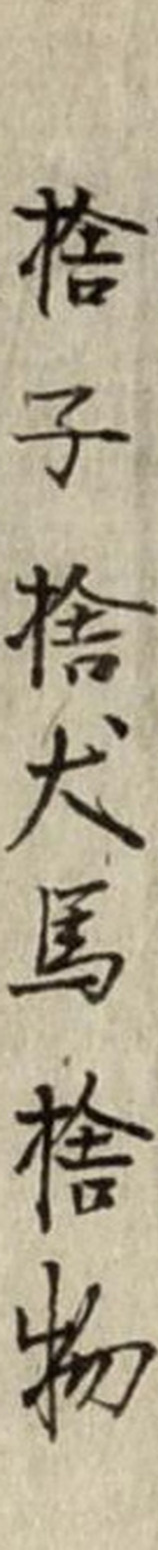カ捨子捨犬馬捨物
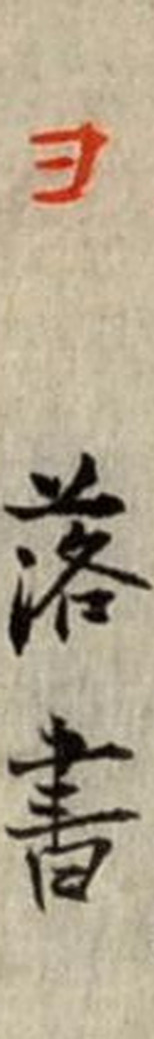ヨ落書
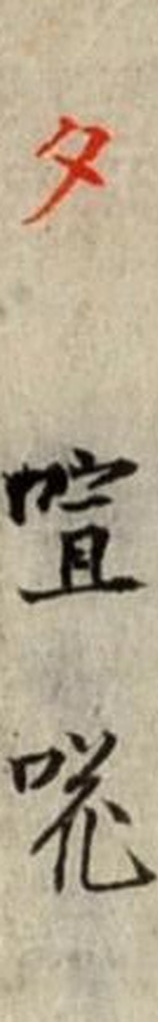タ喧嘩
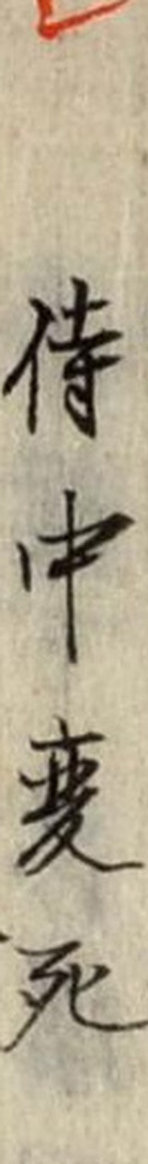レ侍中変死
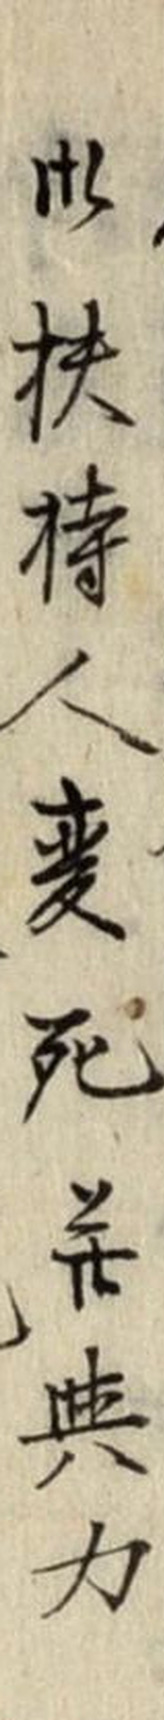ソ御扶持人変死并与力
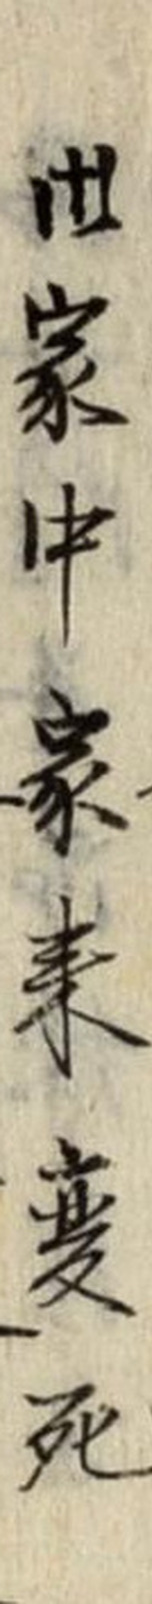ツ御家中家来変死
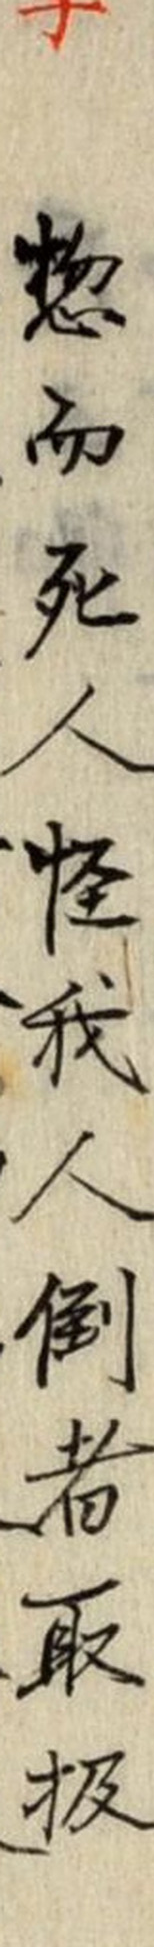ネ惣而死人怪我人倒者取扱
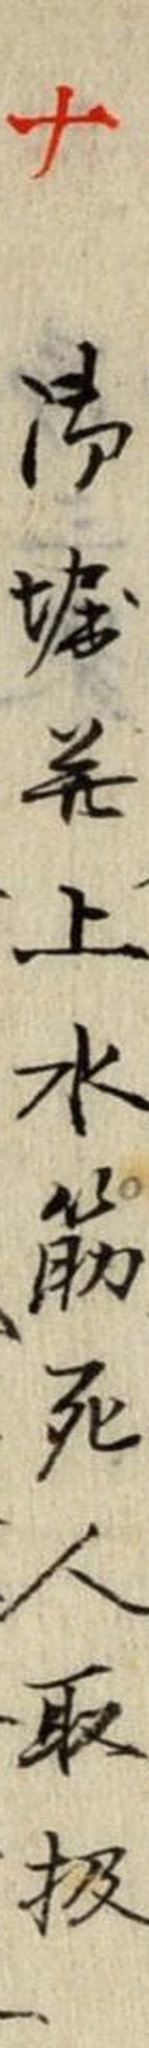ナ御堀并上水筋死人取扱
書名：御停止異変死失
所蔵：福井県文書館 Fukui Prefectural Archives
